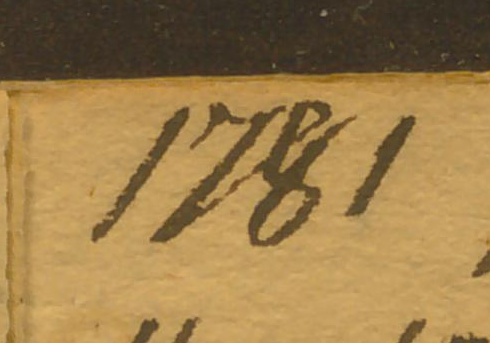1781
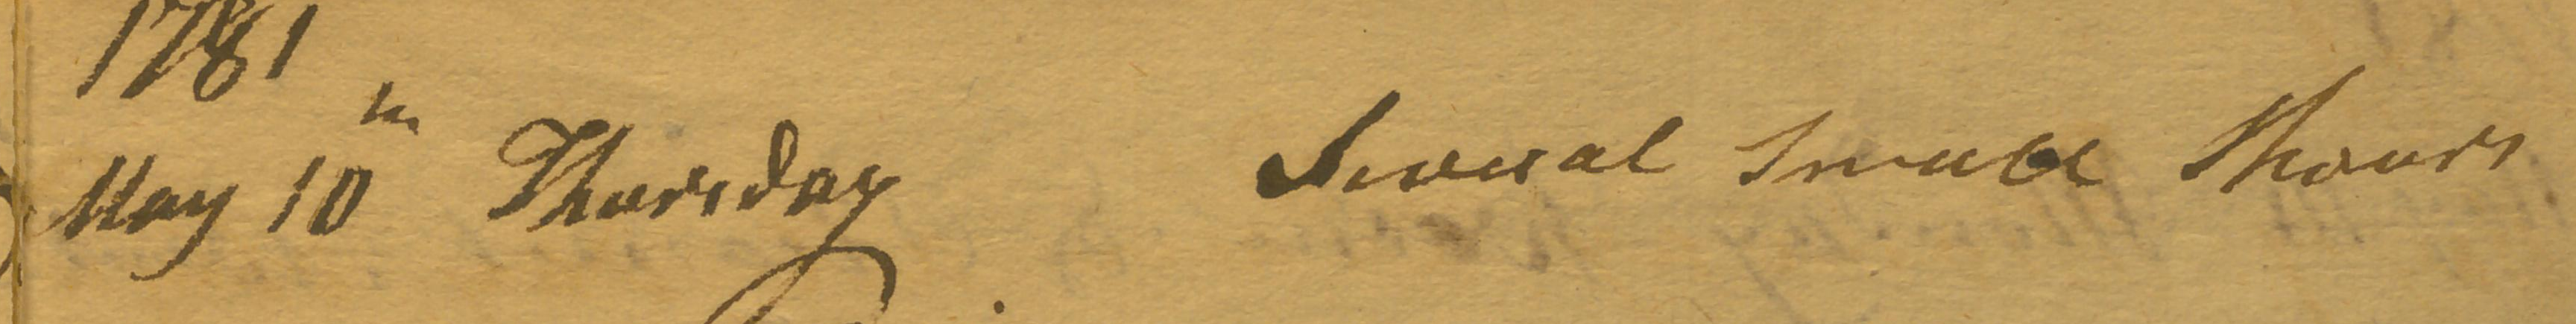May 10^th Thursday several small shours
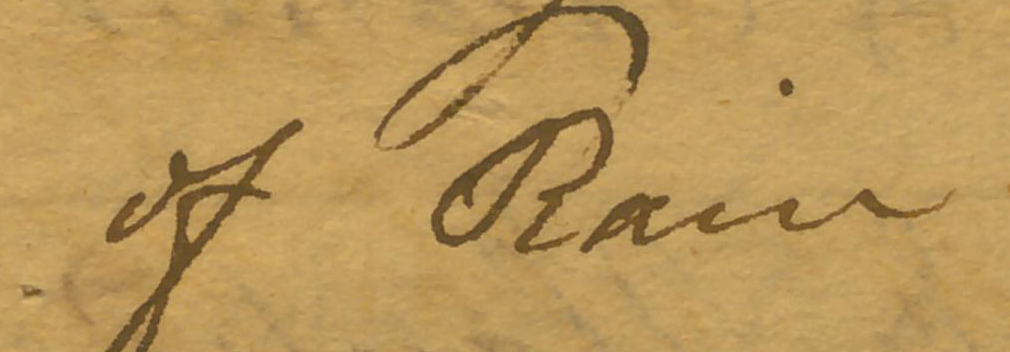of Rain
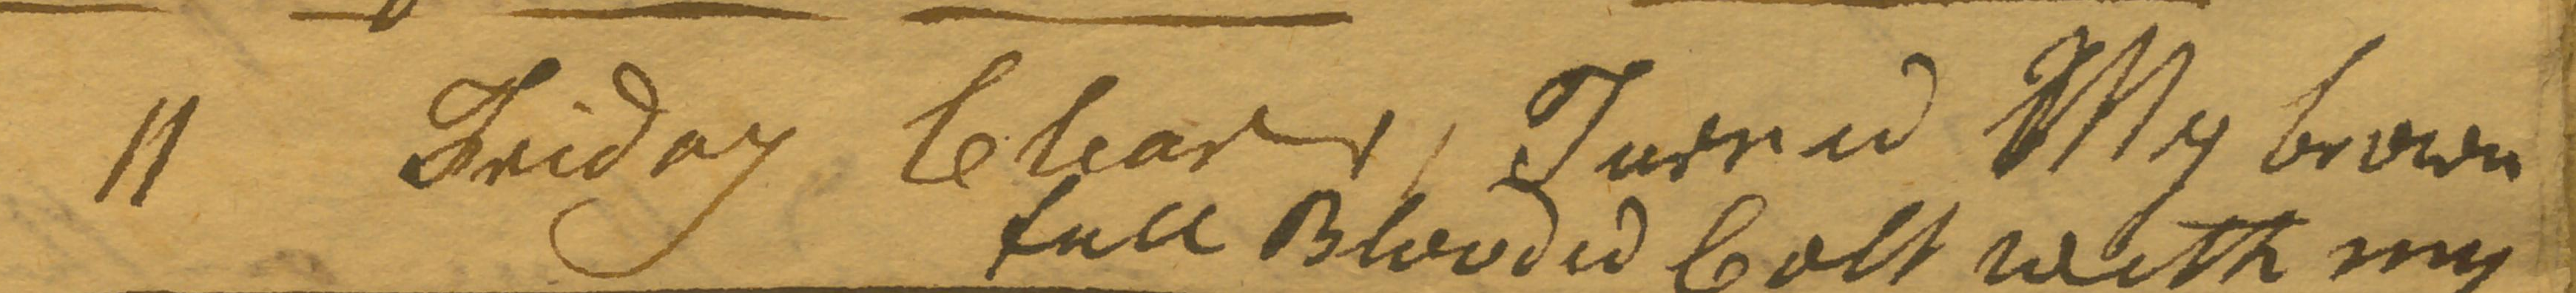11 Friday Clear Turned My brown
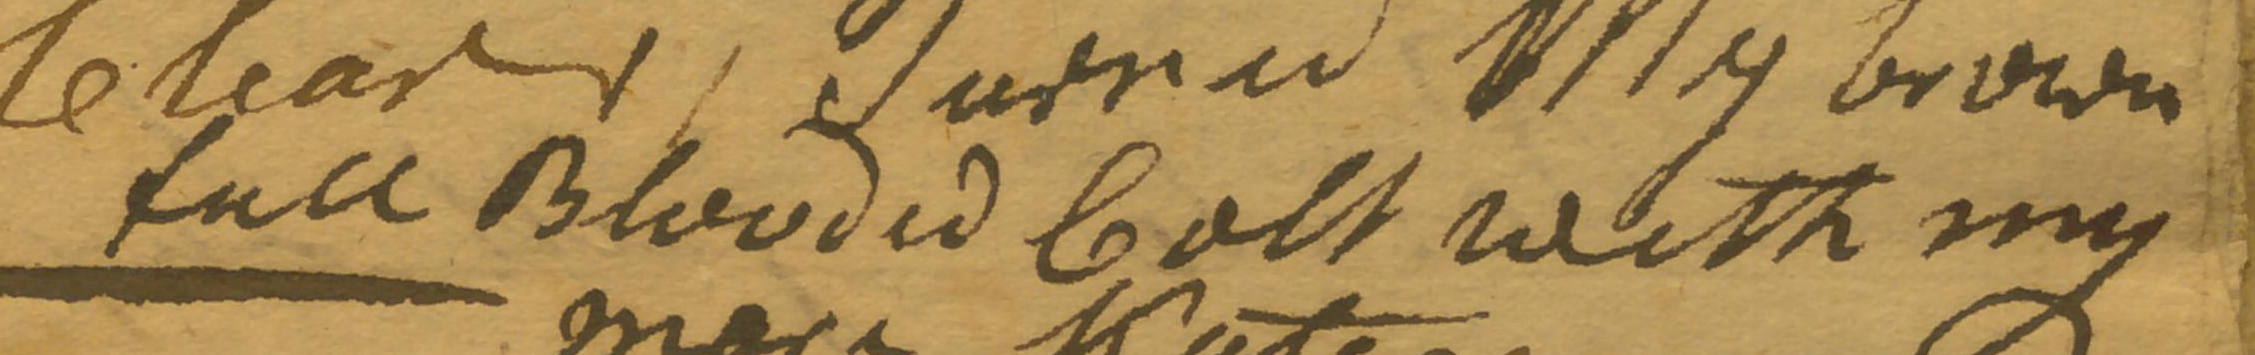fall Blooded Colt with my
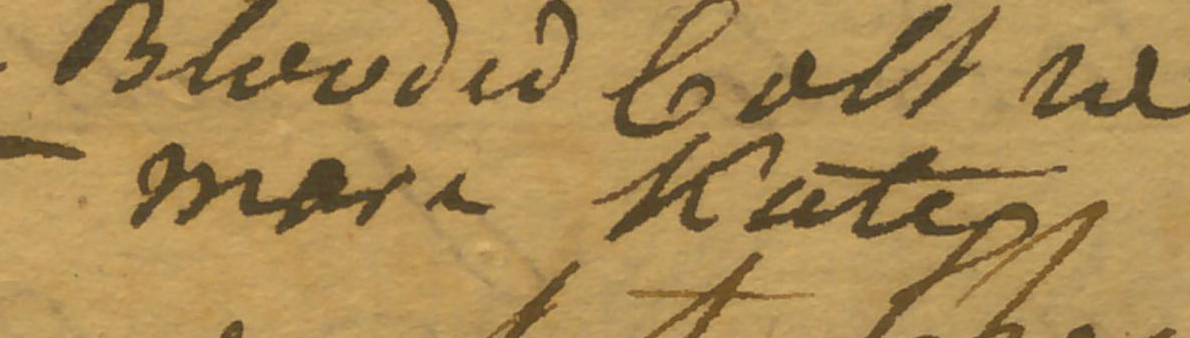mare Kate
